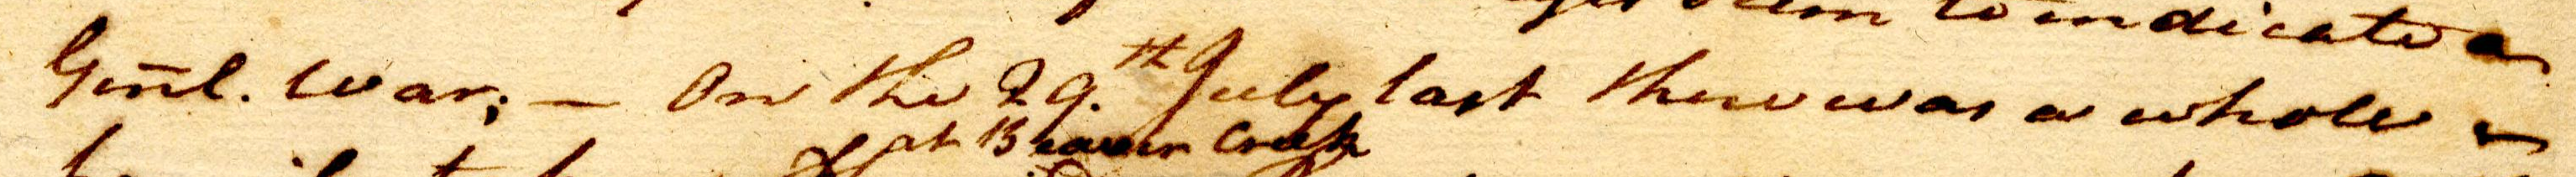Gen̄l. War;- On the 29^th. July last there was a whole -
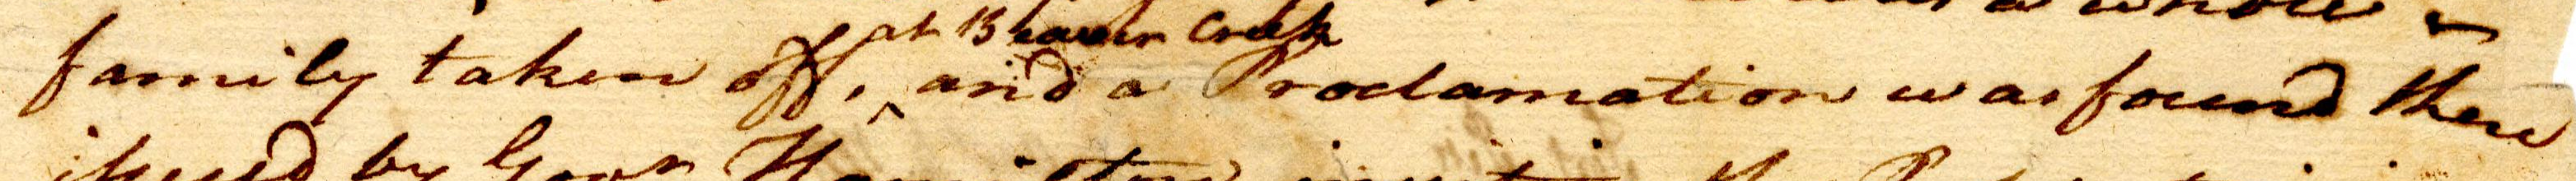family taken off, ^ and a Proclamations was found there
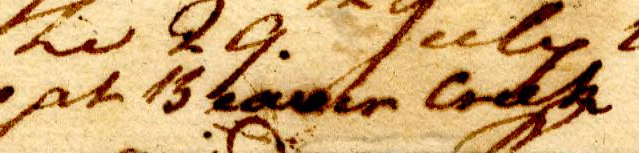at Beaver Creek
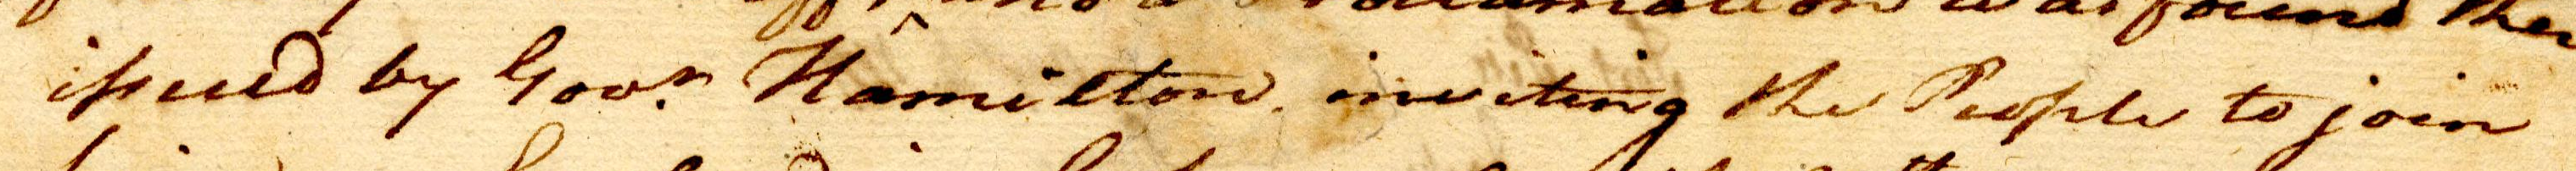issued by Gov^r Hamilton, inviting the People to join
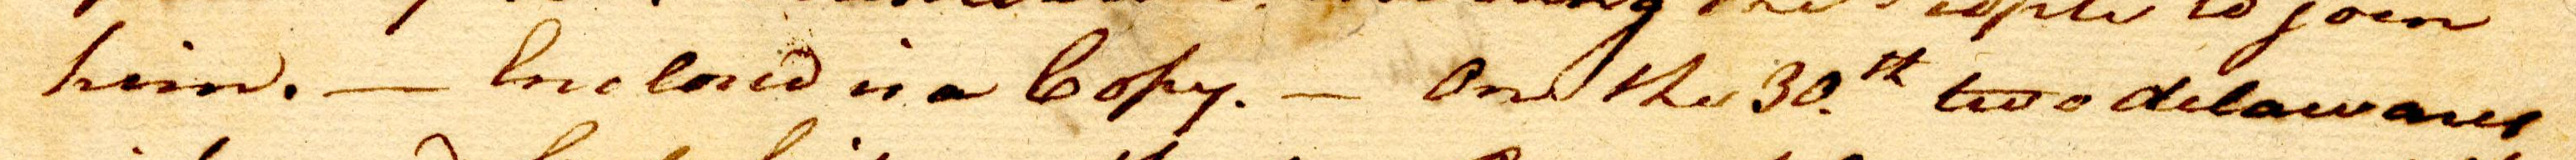him.- Enclosed is a Copy.- On the 30.^th two delawares
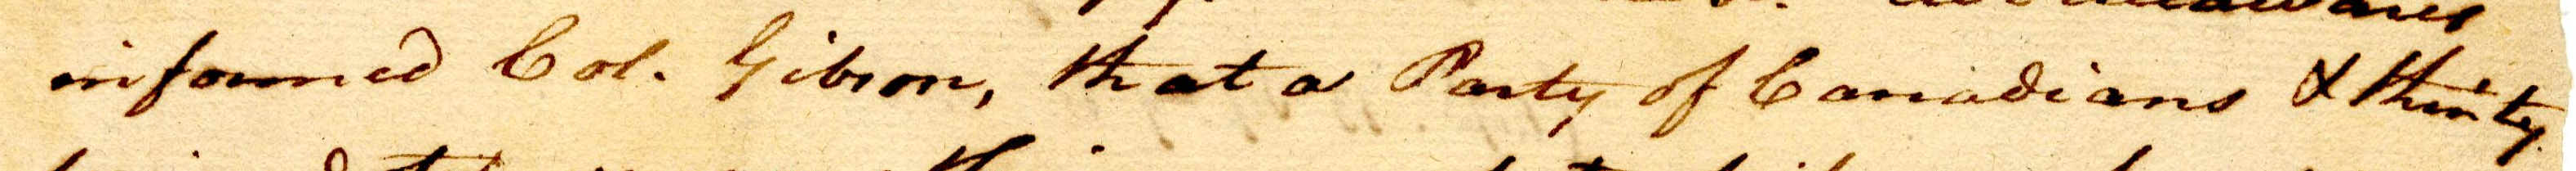informed Col. Gibson, that a Party of Canadians & thirty
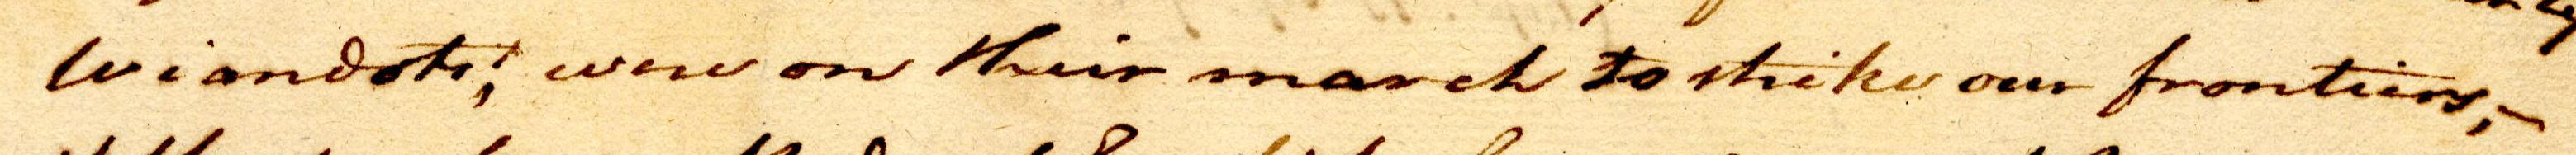Wiandots; were on their march to sticker our frontiers,-
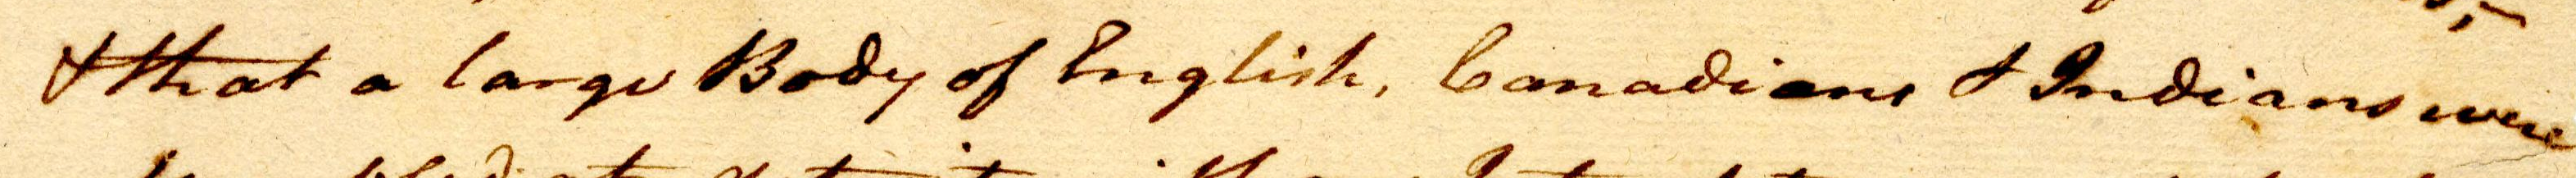& that a large Body of English, Canadians & Indians were
